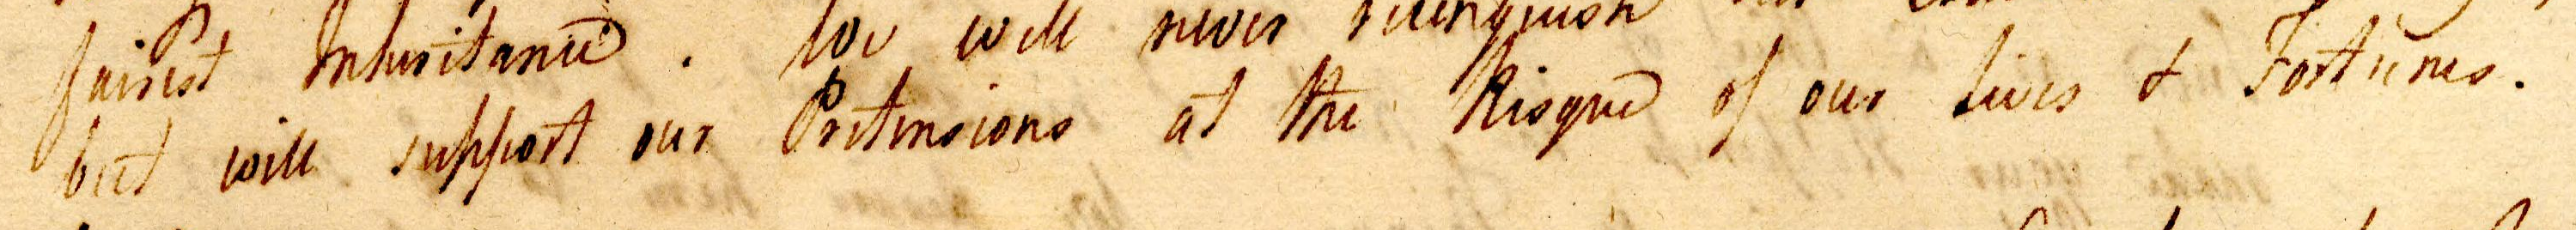but will support our Pretensions at the Risque of our Lives & Fortunes.
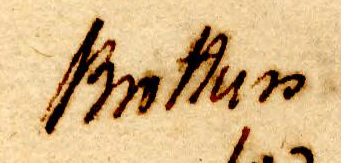Brothers
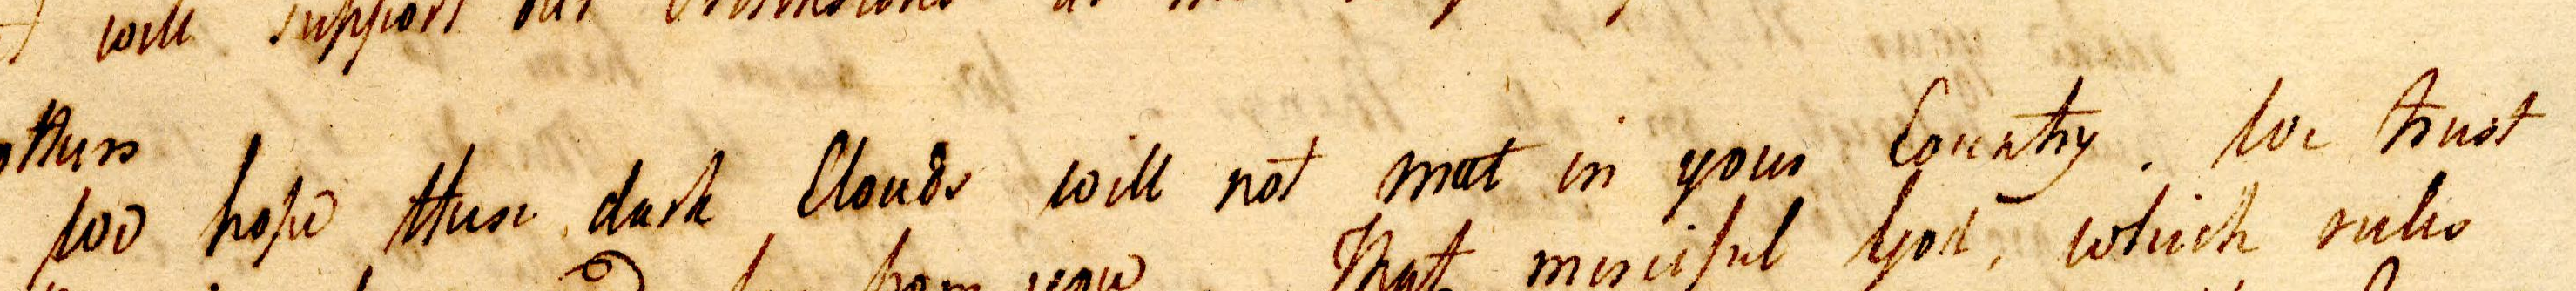We hope these dark Clouds will not meet in your Country. We trust
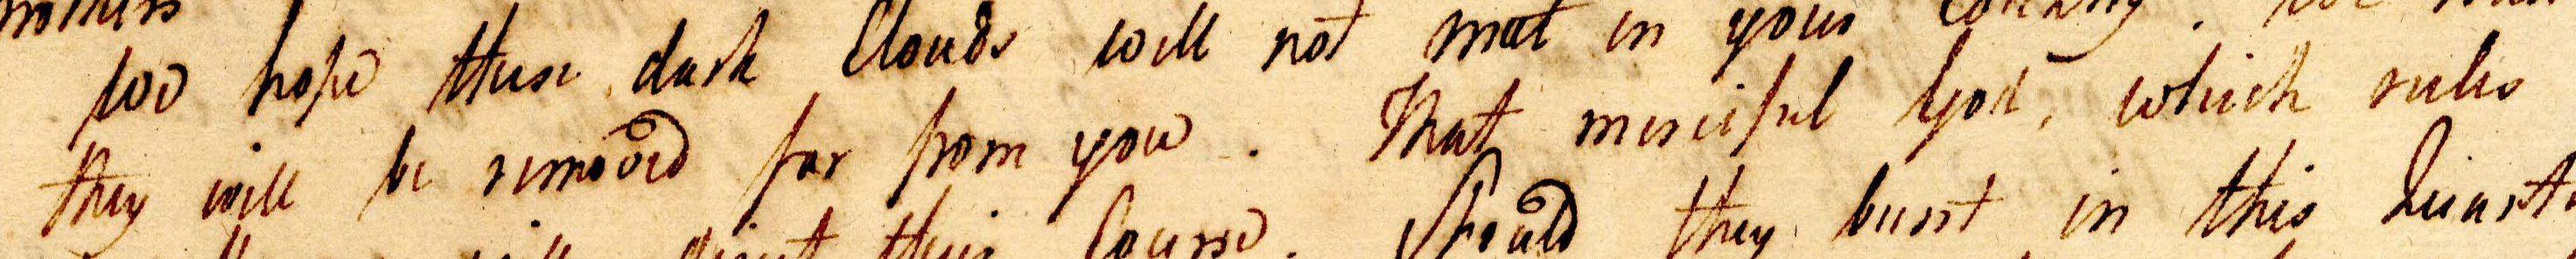they will be removed far from you. That merciful God, which rules
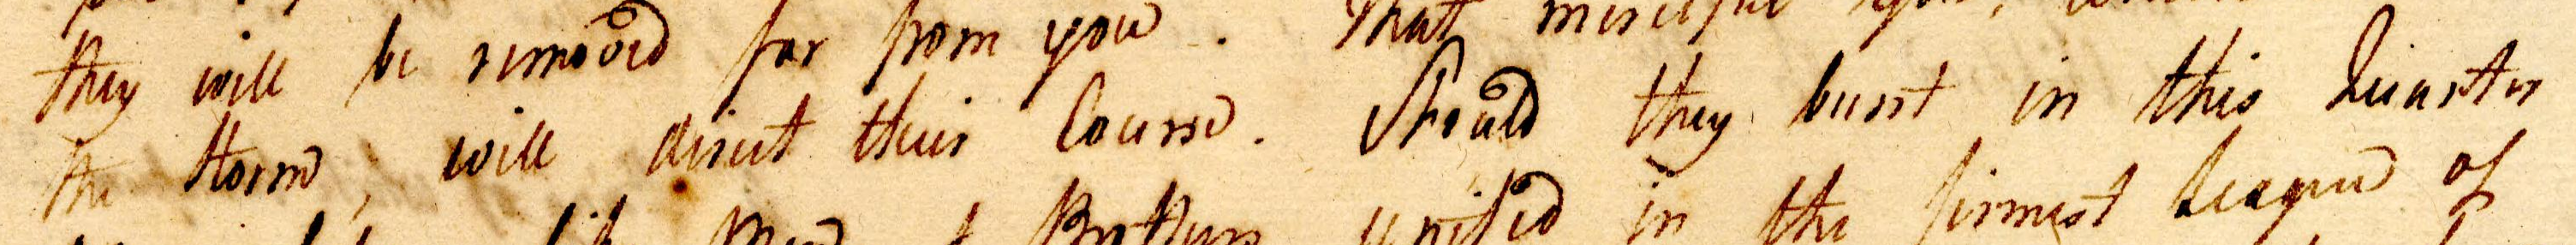the Storm will direct their Course. Should they burst in this Quarter
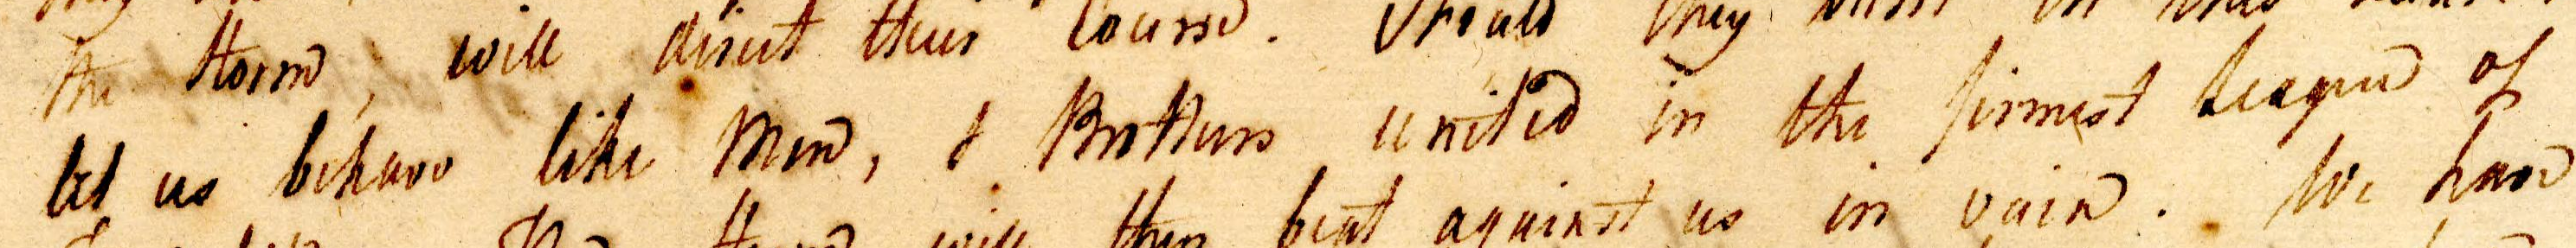let us behave like Men, & Brothers united in the firmest League of
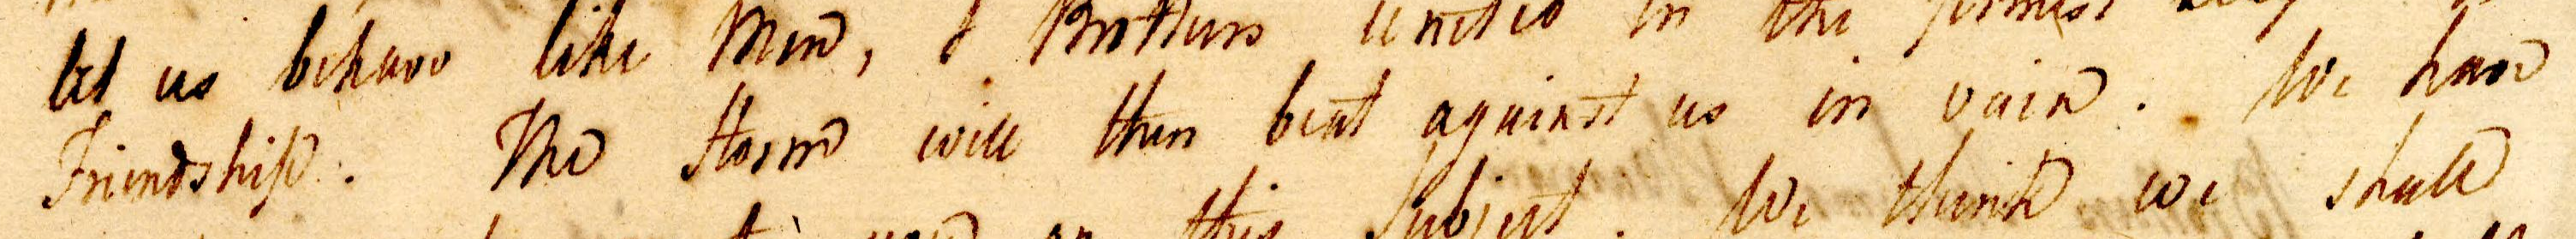Friendship. The Storm will then beat against us in vain. We have
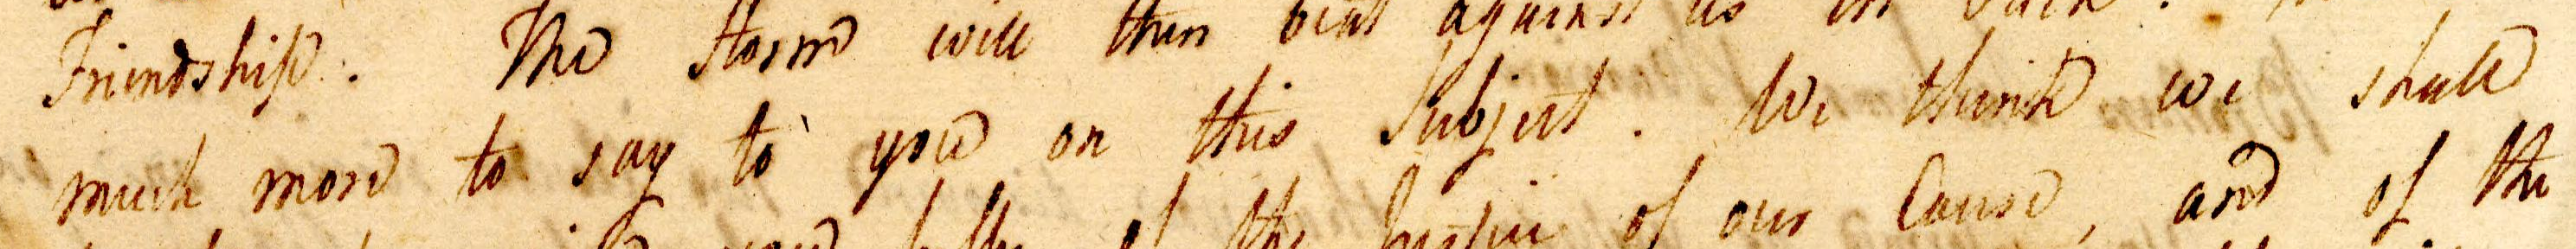much more to say to you on this Subject. We think we shall
